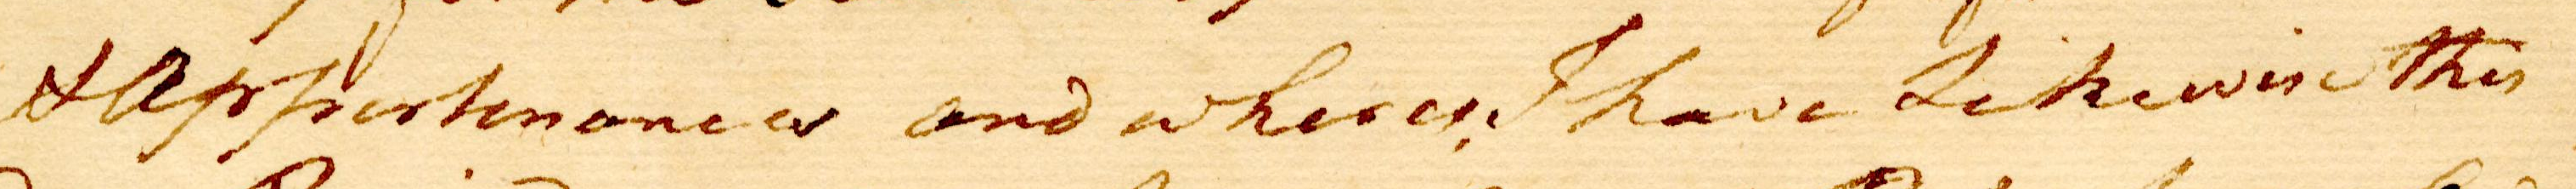& Appertenances and whereas I have Likewise this
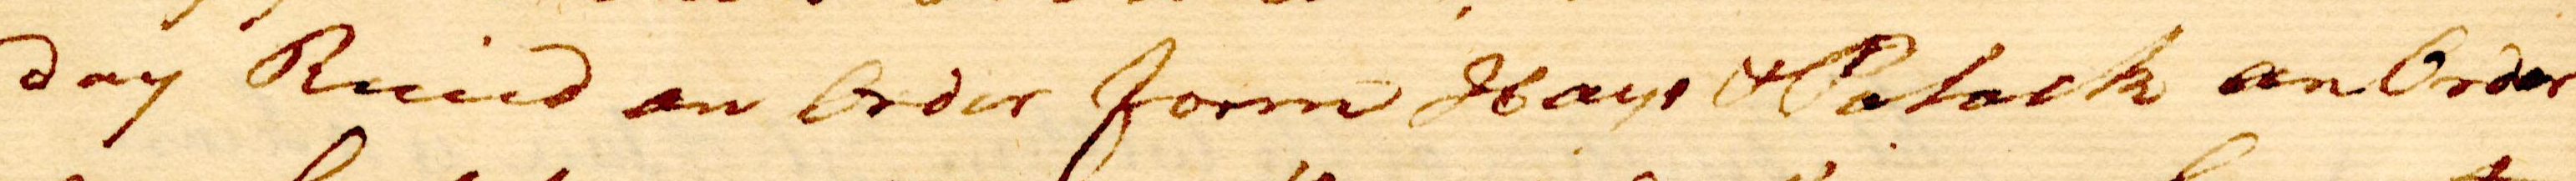day received an order from Hays & Patack an Order
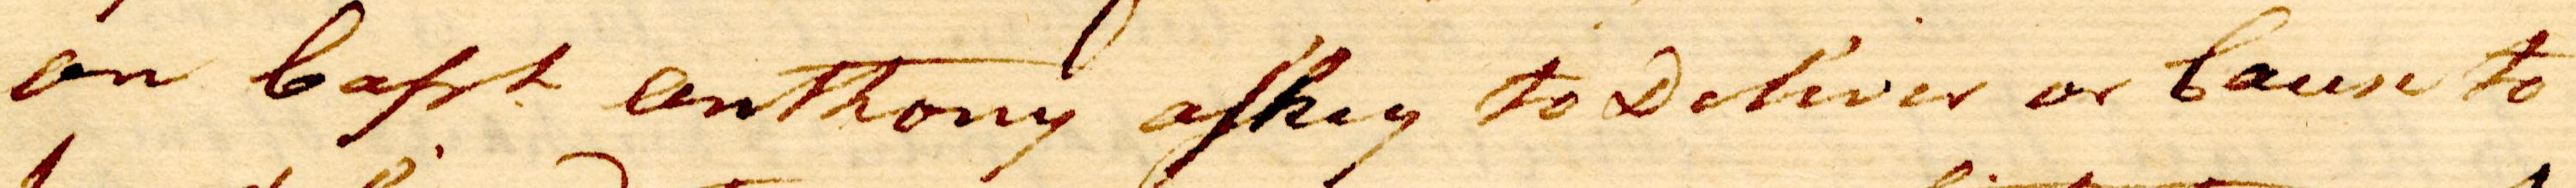on Cap^t Anthony askey to Deliver or Cause to
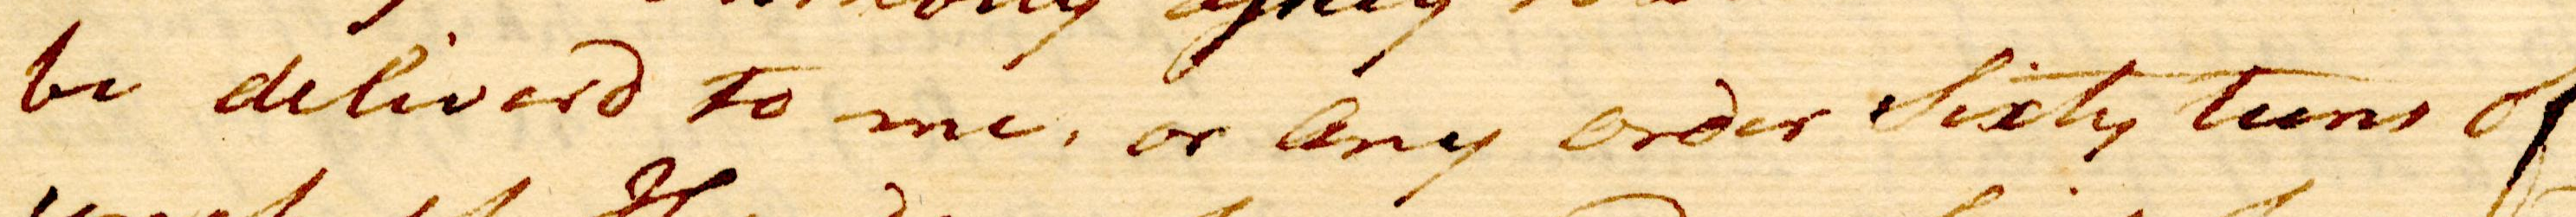be deliverd to me order Sixty tuns of
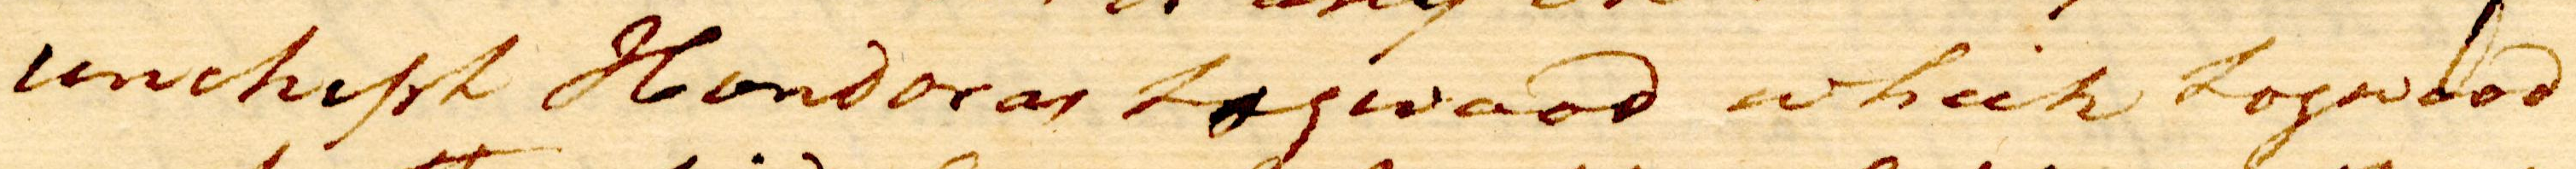unchipt Honduran Logwood which Logwood
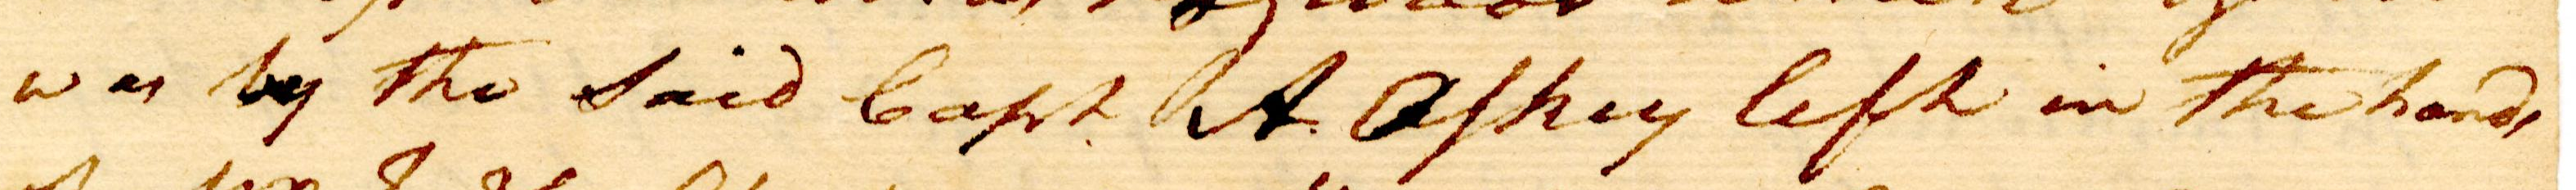was by the said Cap^t t. Askey left in the hands
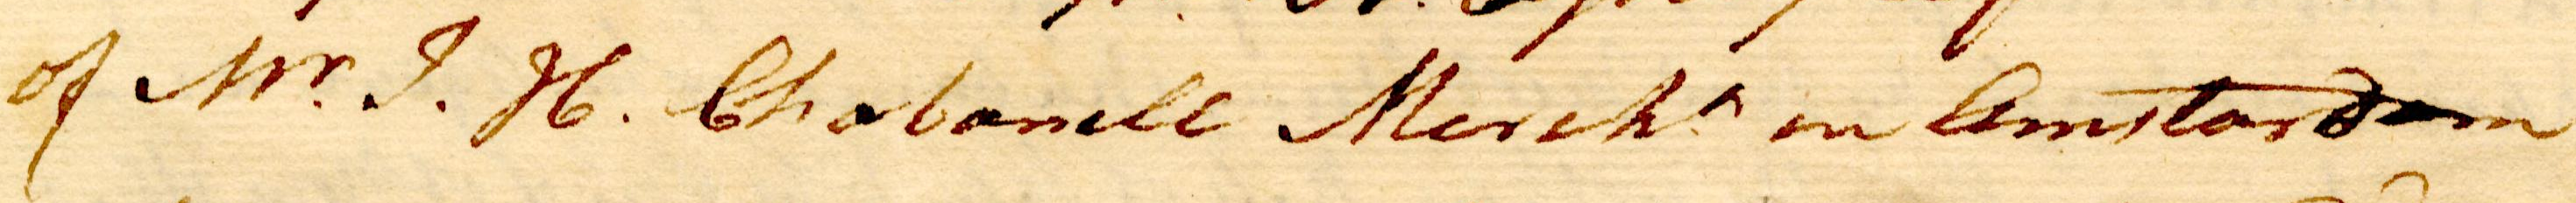of M^r. J. H. Chabanell Merch^t. in Amstardam
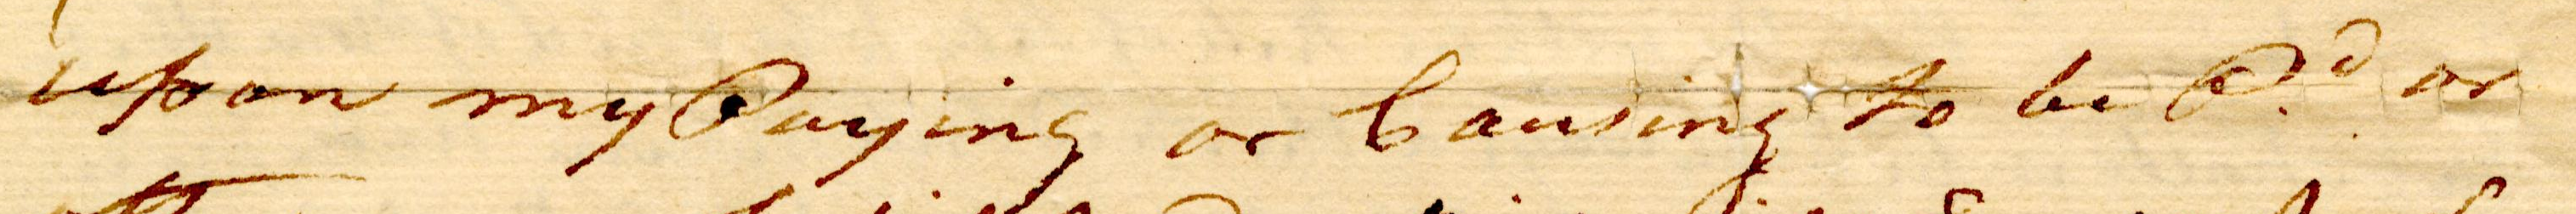upon my Paying Causing to be P^d. or
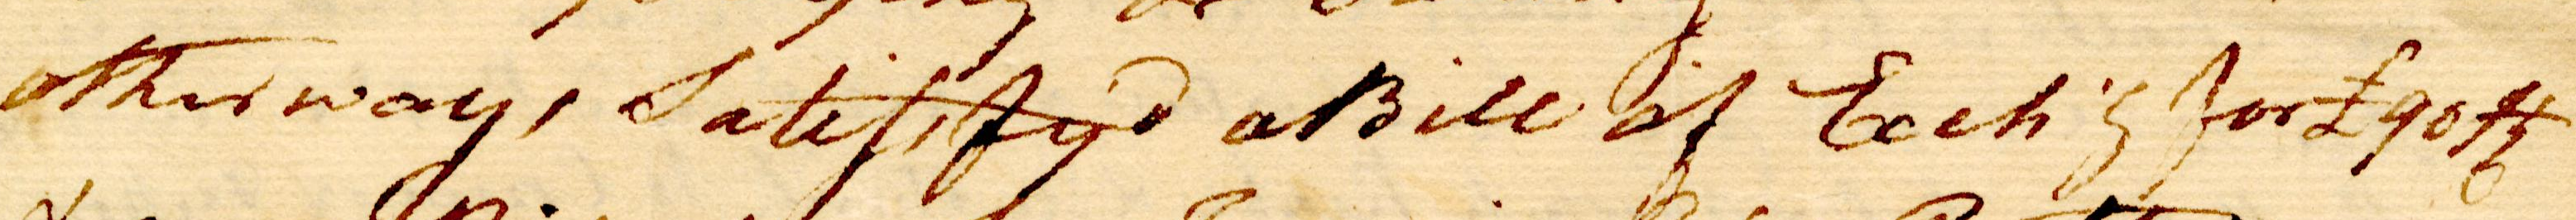otherways Satissfy'd a Bill of Each for £90[__]
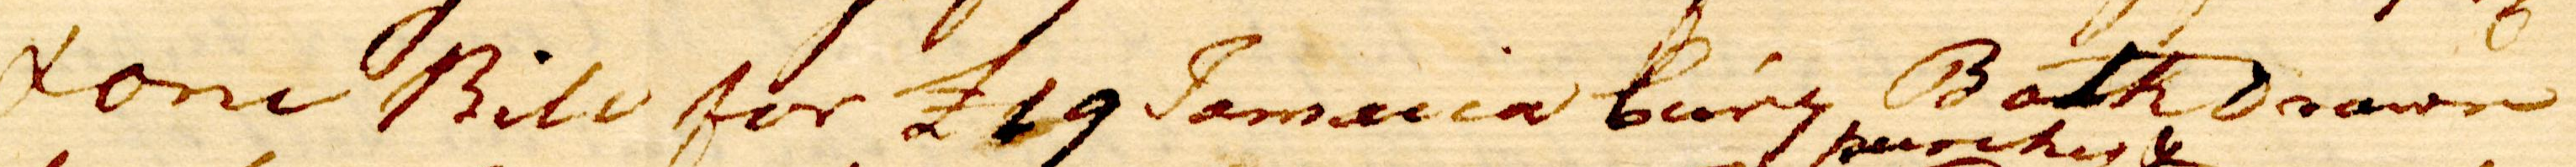& one Bill for £19 Jamaica Cury, Both drawn
